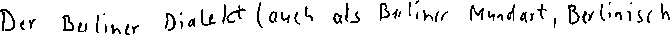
Der Berliner Dialekt (auch als Berliner Mundart, Berlinisch
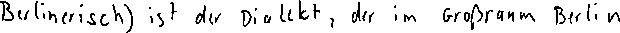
Berlinerisch) ist der Dialekt, der im Großraum Berlin
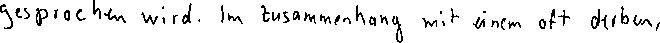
esprochen wird. Im Zusammenhang mit einem oft derben,
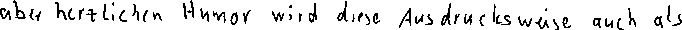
aber herzlichen Humor wird diese Ausdrucksweise auch als
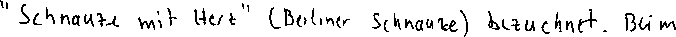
"Schnauze mit Herz" (Berliner Schnauze) bezeichnet. Beim
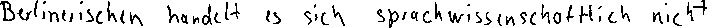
Berlinerischen handelt es sich sprachwissenschaftlich nicht
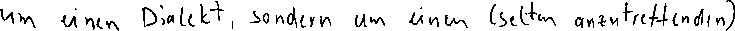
um einen Dialekt, sondern um einen (selten anzutreffenden)
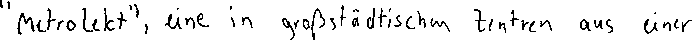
"Metrolekt", eine in großstädtischen Zentren aus einer
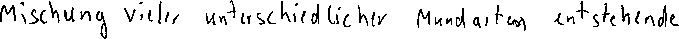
Mischung vieler unterschiedlicher Mundarten entstehende
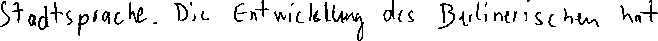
Stadtsprache. Die Entwicklung des Berlinerischen hat
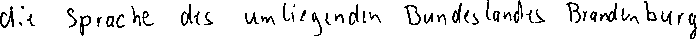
die Sprache des umliegenden Bundeslandes Brandenburg
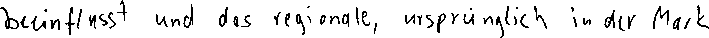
beeinflusst und das regionale, ursprünglich in der Mark
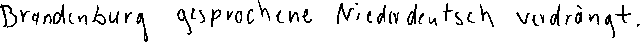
Brandenburg gesprochene Niederdeutsch verdrängt.
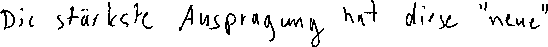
Die stärkste Ausprägung hat diese "neue"
